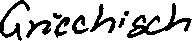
Griechisch
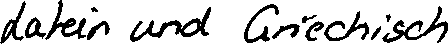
Latein und Griechisch
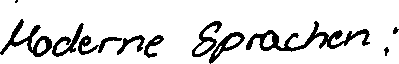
Moderne Sprachen:
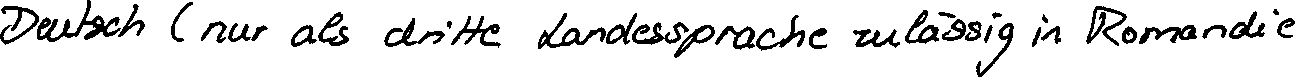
Deutsch (nur als dritte Landessprache zulässig in Romandie
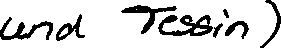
und Tessin)
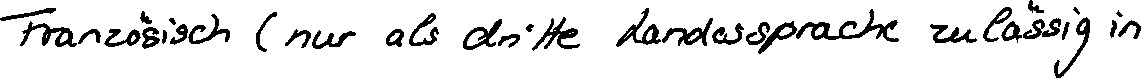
Französisch (nur als dritte Landessprache zulässig in
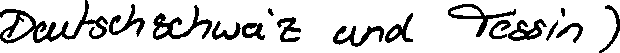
Deutschschweiz und Tessin)
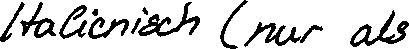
Italienisch (nur als
